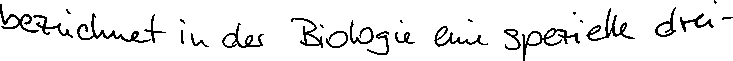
bezeichnet in der Biologie eine spezielle drei-
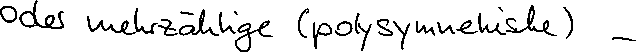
oder mehrzählige (polysym-
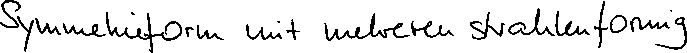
Symmetrieform mit mehreren strahlenförmig
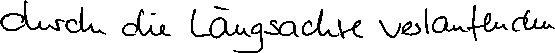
durch die Längsachse verlaufenden
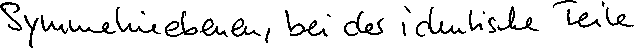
Symmetrieebenen, bei der identische Teile
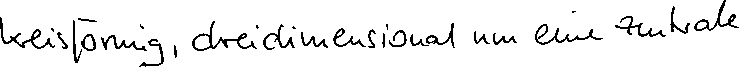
kreisförmig, dreidimensional um eine zentrale
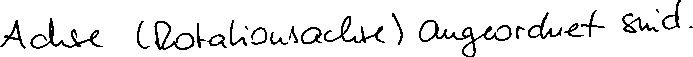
Achse (Rotationsachse) angeordnet sind.
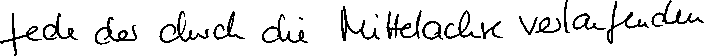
Jede der durch die Mittelachse verlaufenden
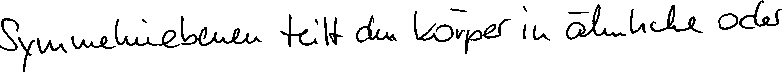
Symmetrieebenen teilt den Körper in ähnliche oder
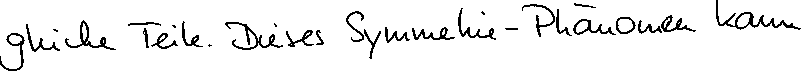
gleiche Teile. Dieses Symmetrie-Phänomen kann
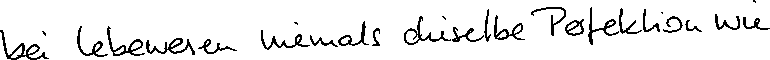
bei Lebewesen niemals dieselbe Perfektion wie
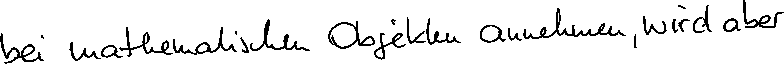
bei mathematischen Objekten annehmen, wird aber
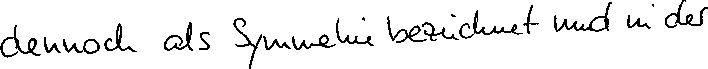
dennoch als Symmetrie bezeichnet und in der
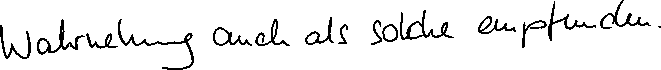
Wahrnehmung auch als solche empfunden.
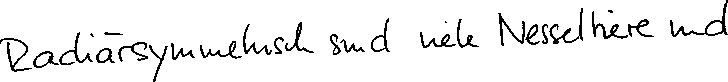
Radiärsymmetrisch sind viele Nesseltiere und
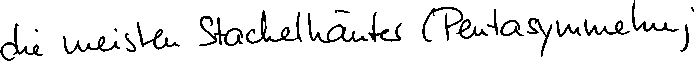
die meisten Stachelhäuter (Pentasymmetrie;
